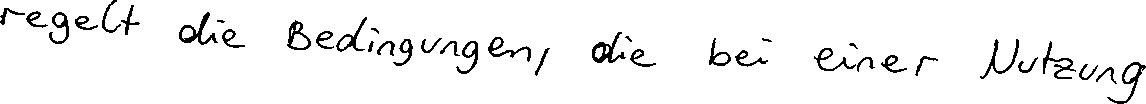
regelt die Bedingungen, die bei einer Nutzung
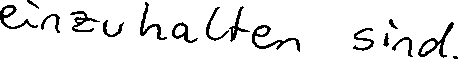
einzuhalten sind.
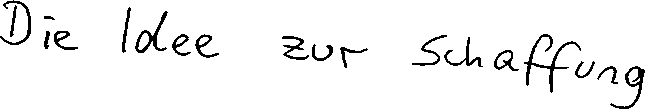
Die Idee zur Schaffung
